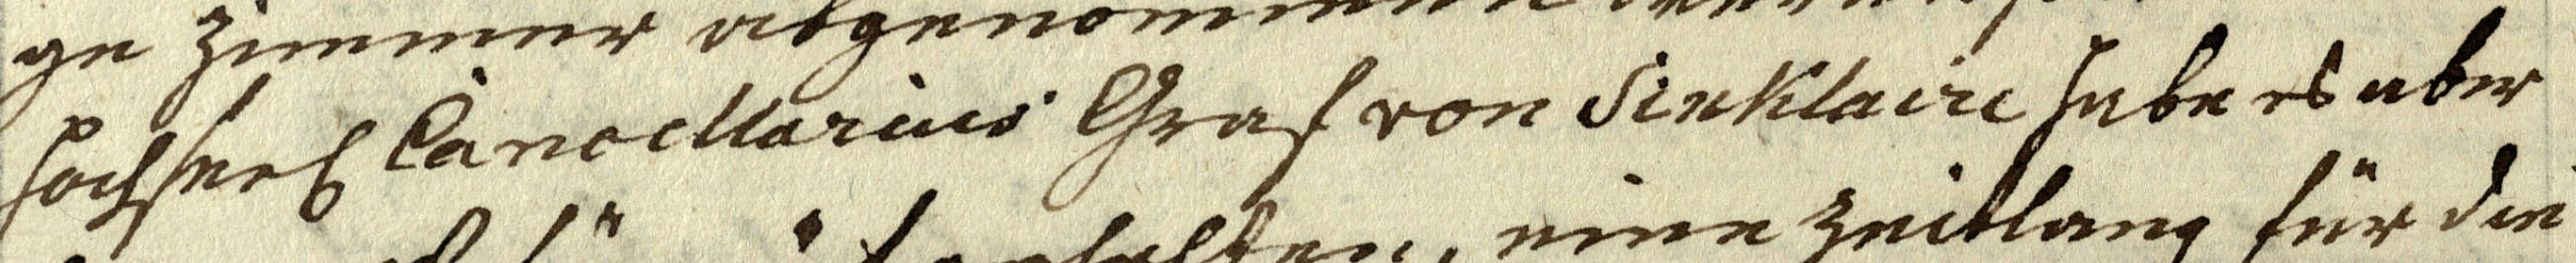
hochseel. Cancellarius Graf von Sinklaire habe es aber
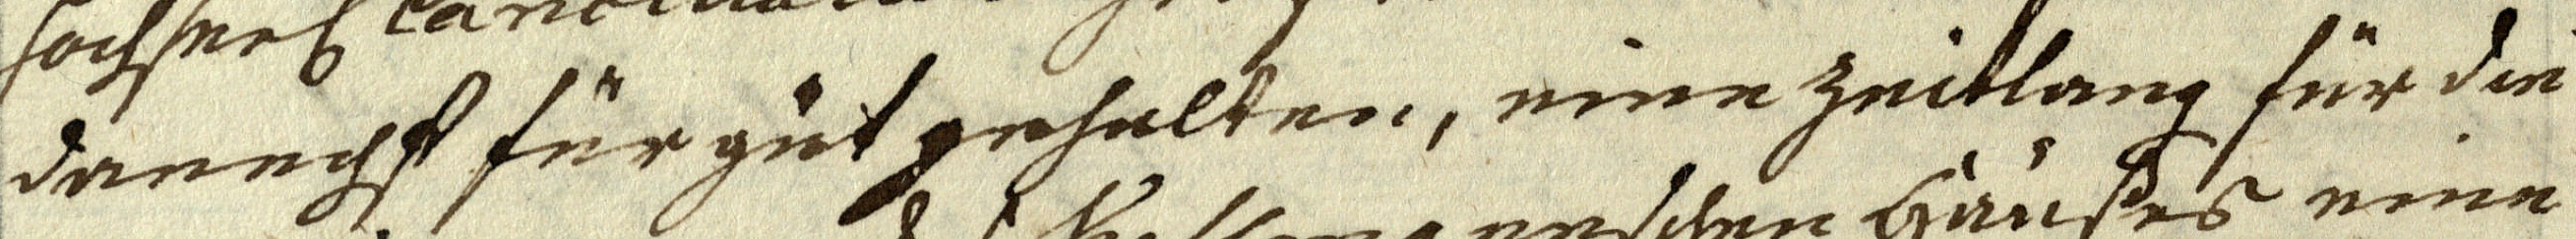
danechst für gut gehalten, eine zeitlang für die
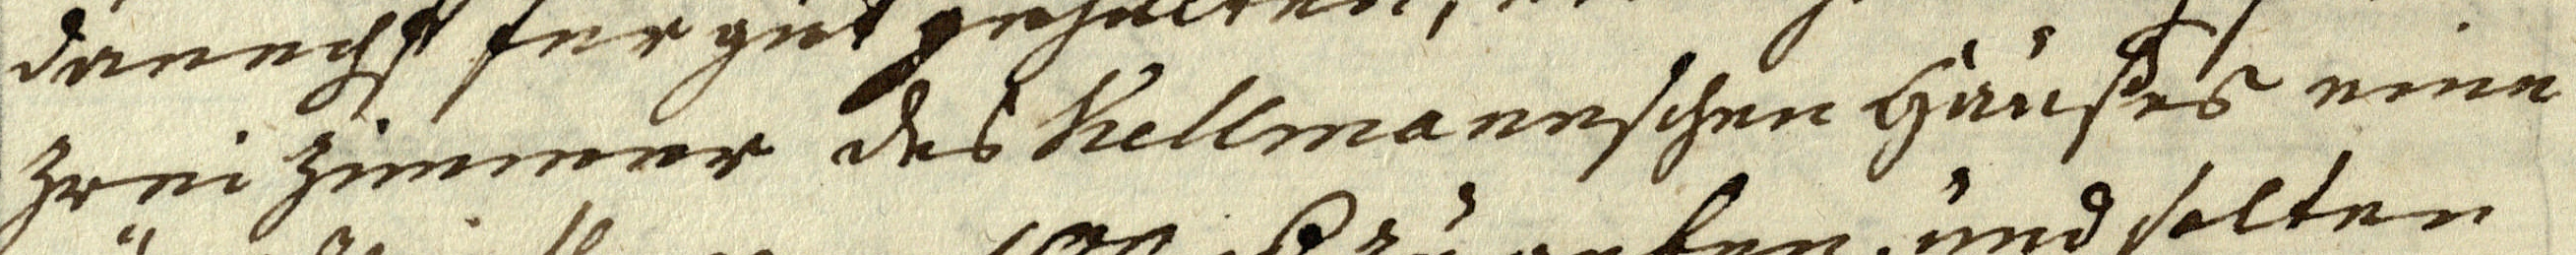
zwei Zimmer des Kellmannschen Haußes eine
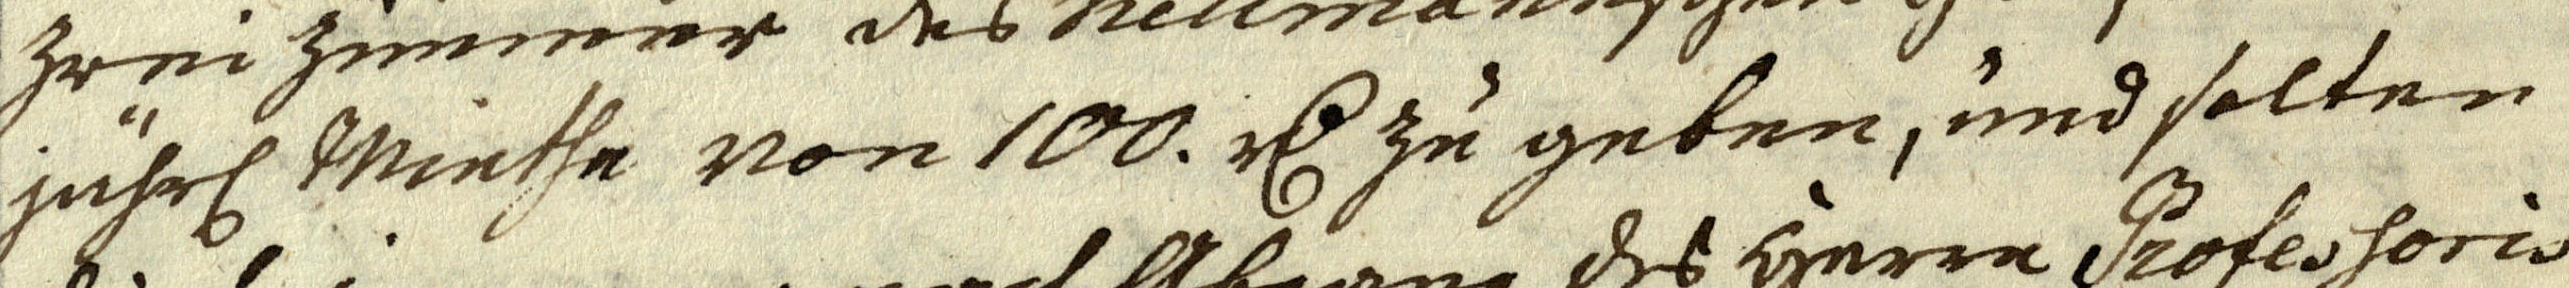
jährliche Miethe von 100. rl. zu geben, und solten
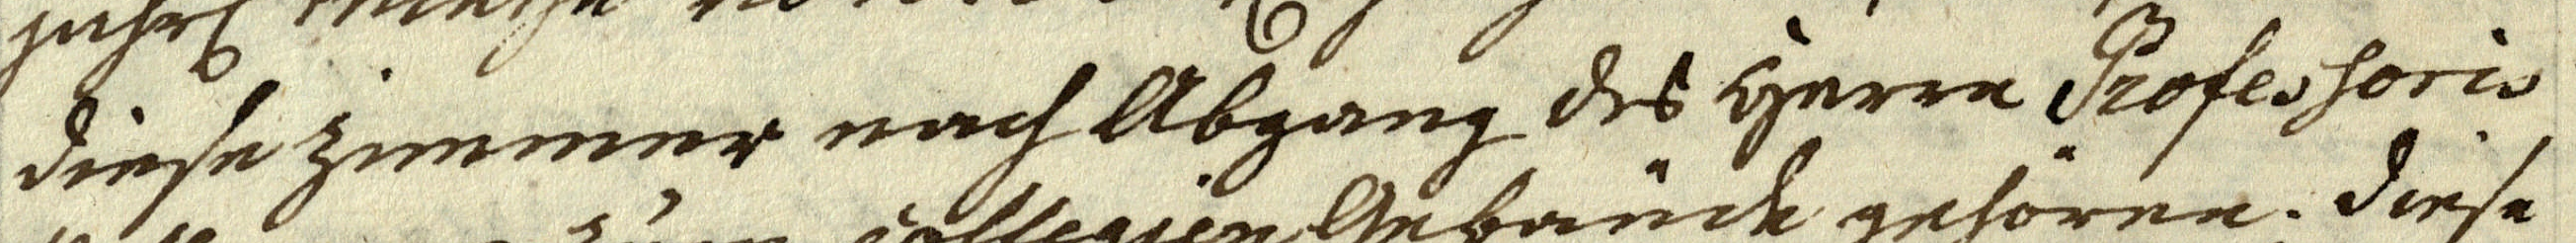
diese Zimmer nach Abgang des Herr Professoris
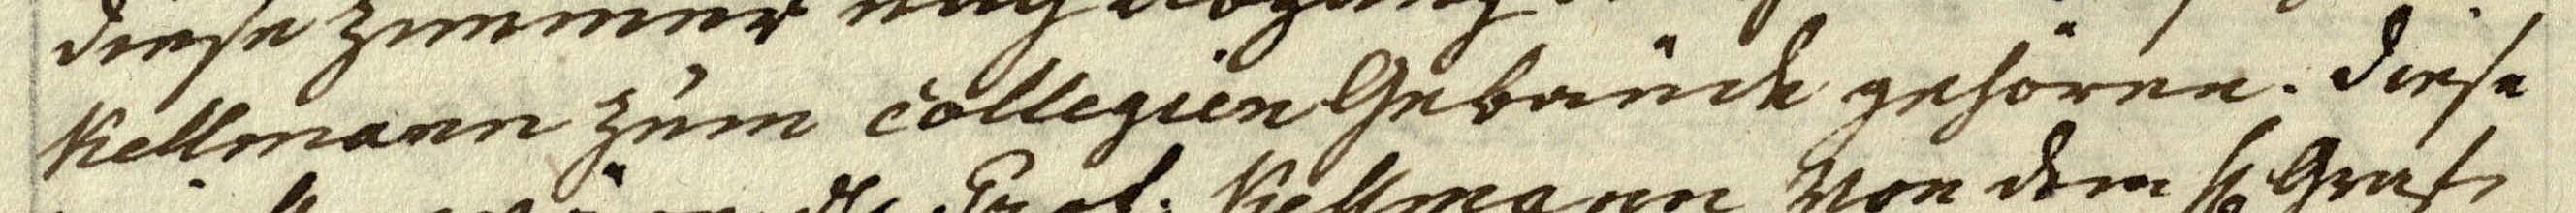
Kellmann zum Collegien Gebäude gehören. Diese
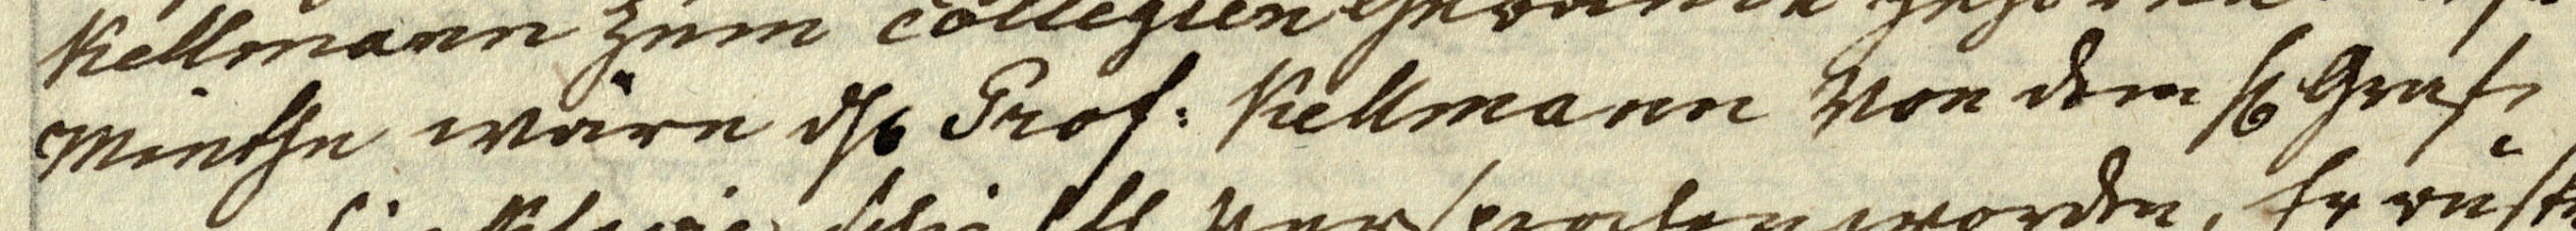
Miethe wäre dh. Prof. Kellmann von dem h. Graf
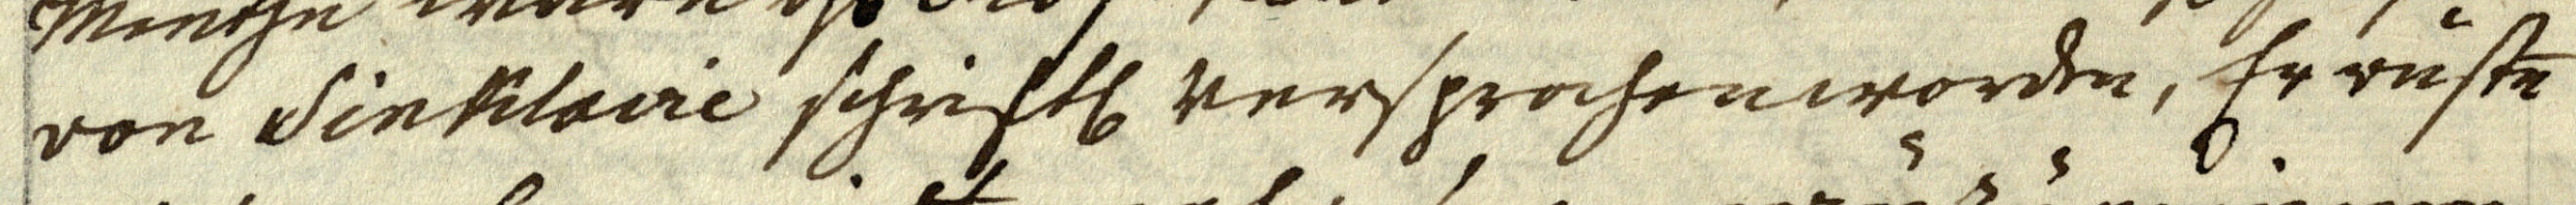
von Sinclaire schriftl. versprochen worden, Er wüste
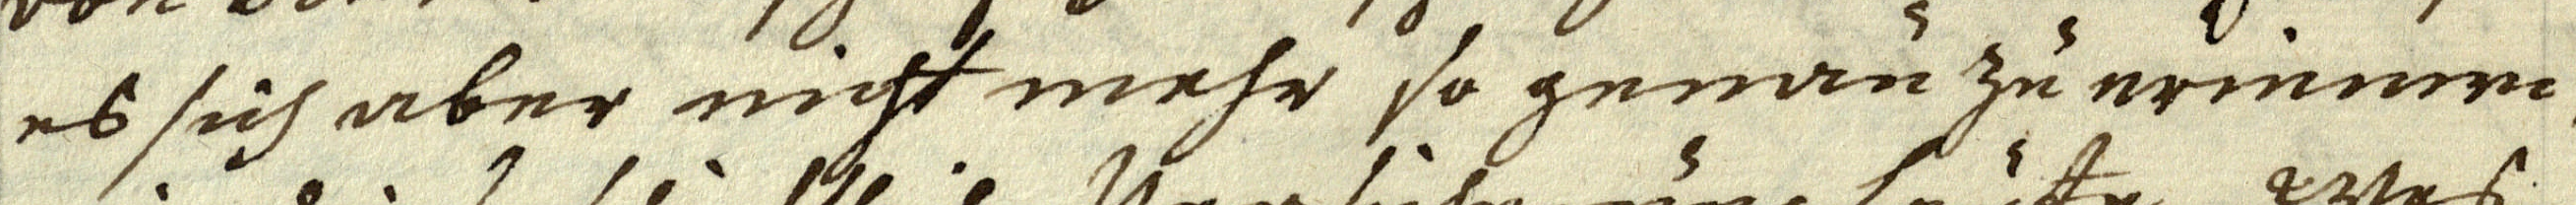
es sich aber nicht mehr so genau zu erinnern,
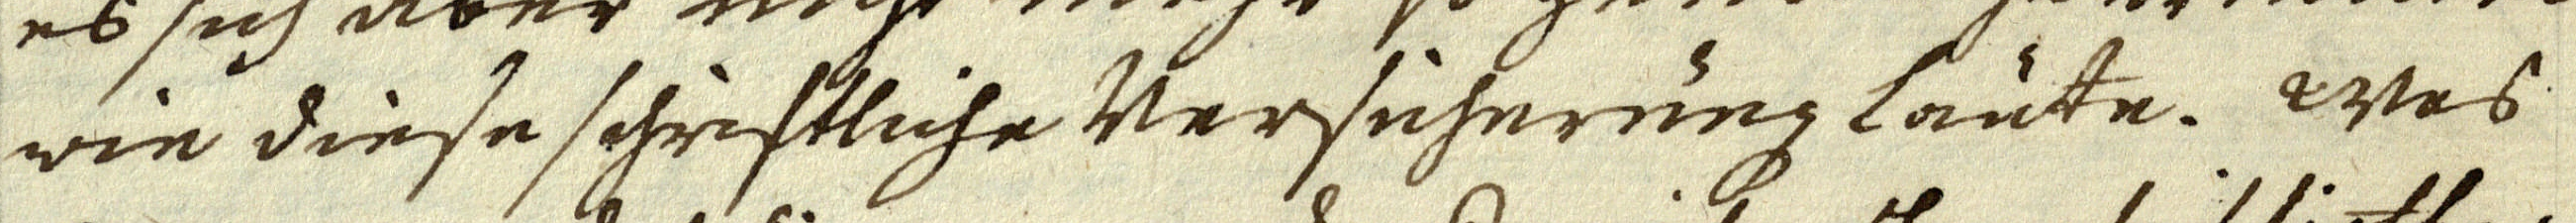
wie diese schriftliche Versicherung laute. Was
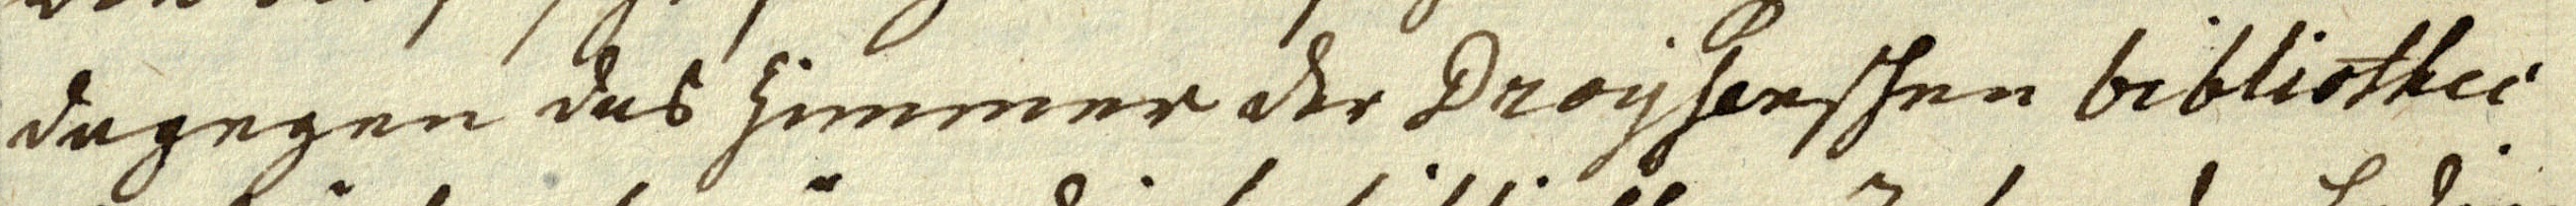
dagegen das Zimmer der Droÿsenschen Bibliothec
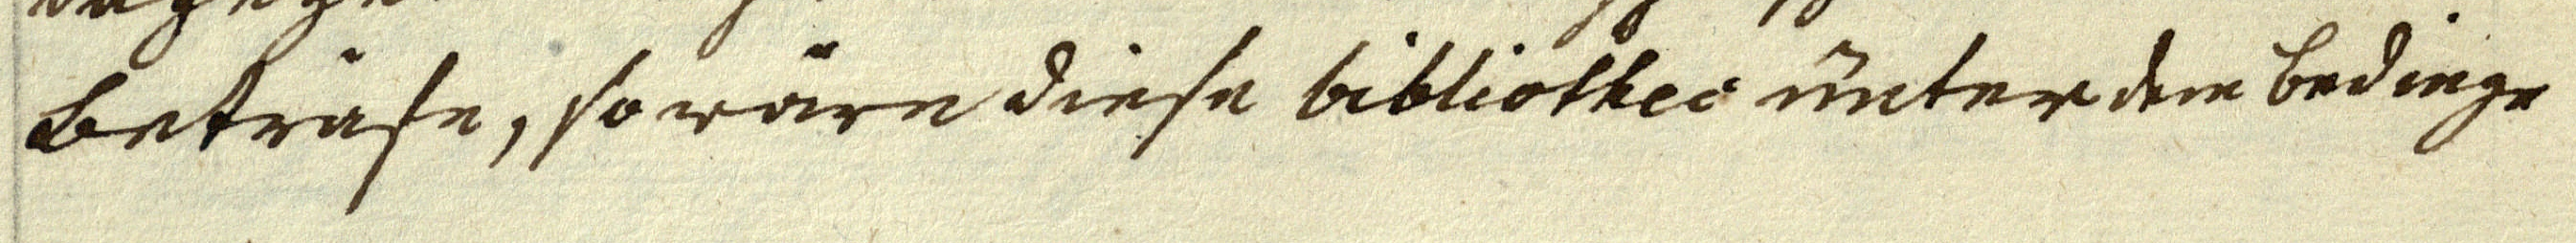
beträfe, so wäre diese Bibliothec unter dem bedinge
